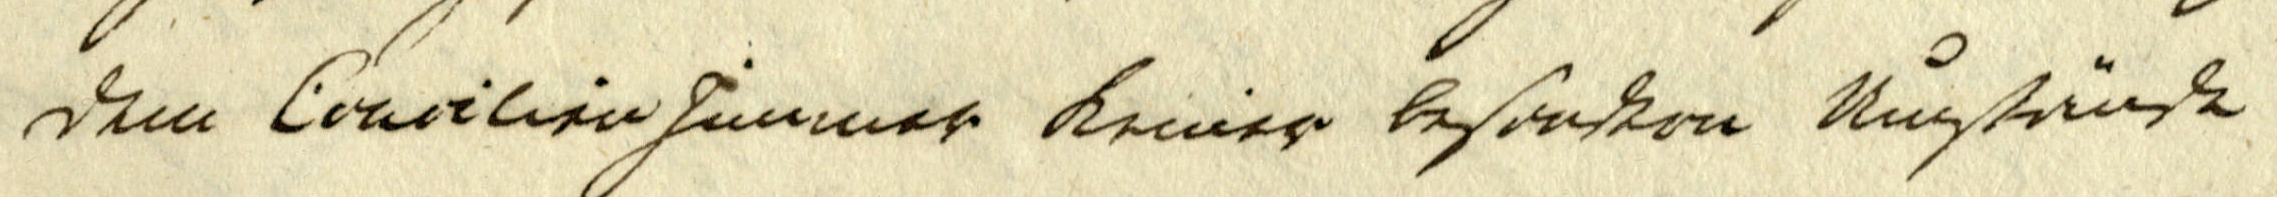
dem Concilienzimmer keiner besondern Umstände
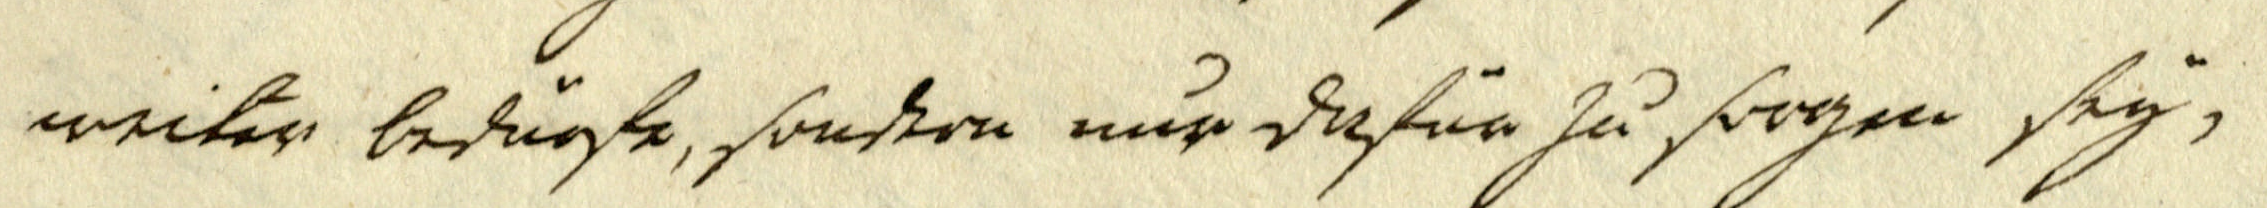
weiter bedürfe, sondern nur dafür zu sorgen seÿ,
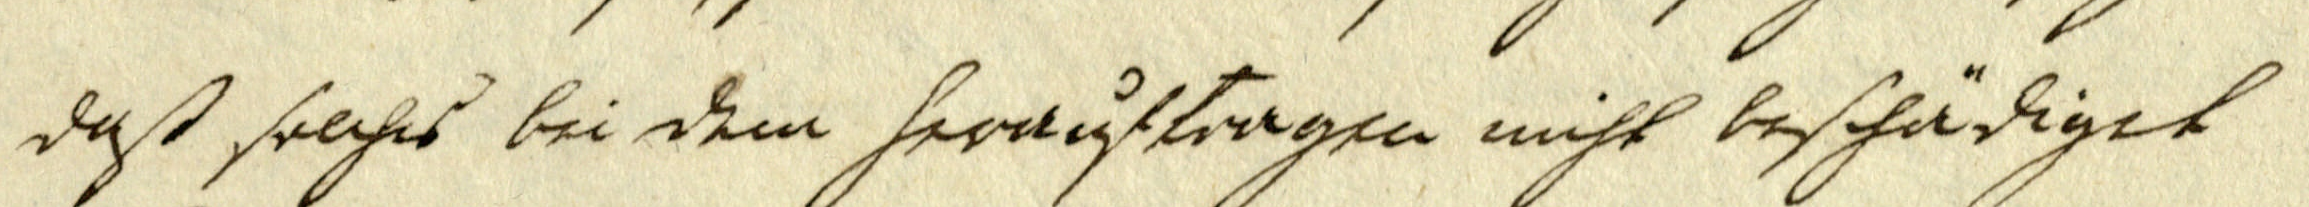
daß solches bei dem herauftragen nicht beschädiget
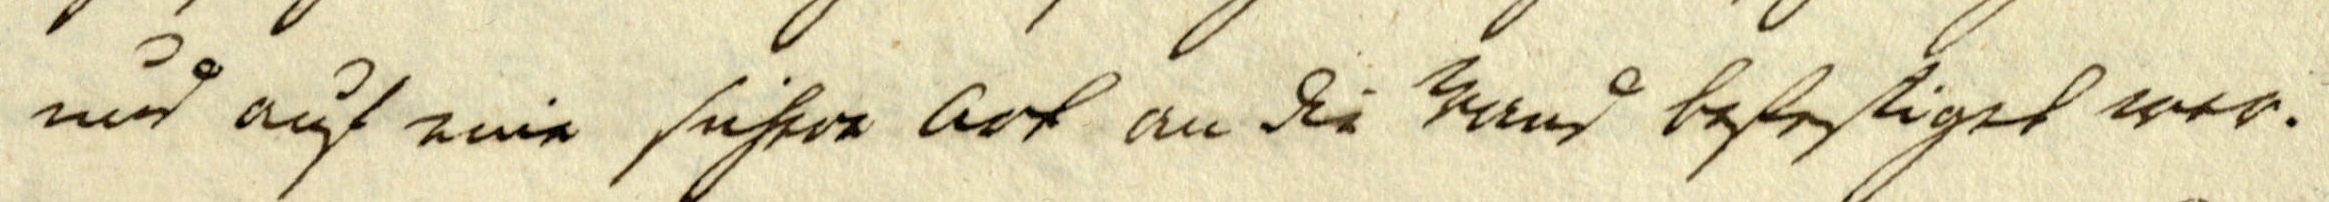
und auf eine sichere Art an die Wand befestiget wer¬
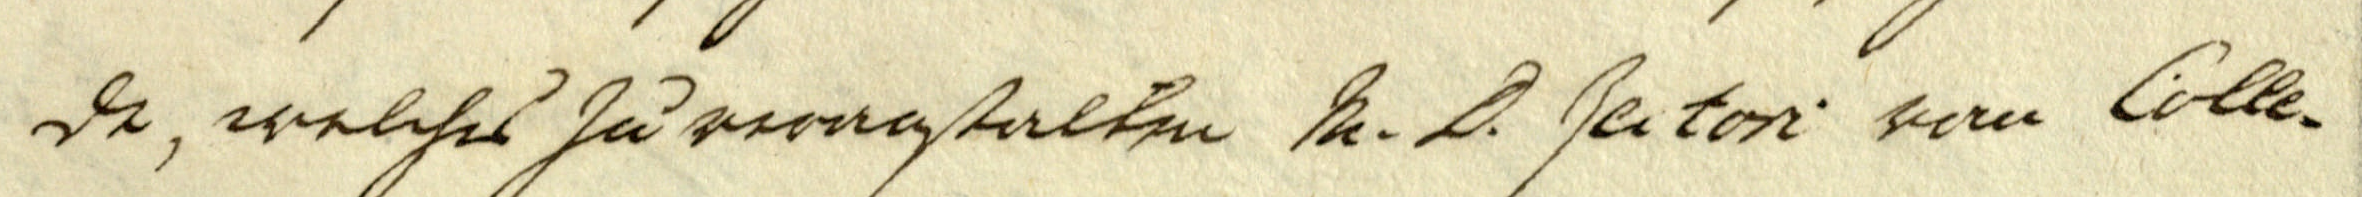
de, welches zu veranstalten M. D. Rectori vom Colle¬
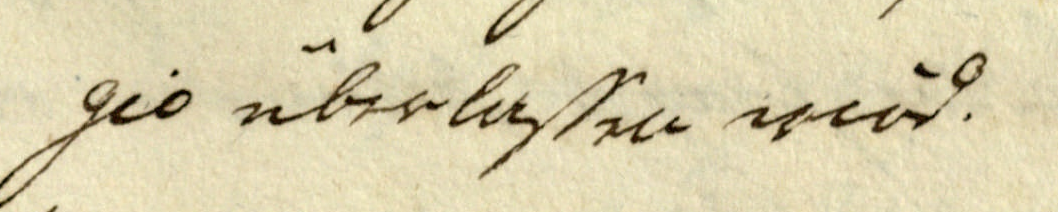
gio überlassen wird.
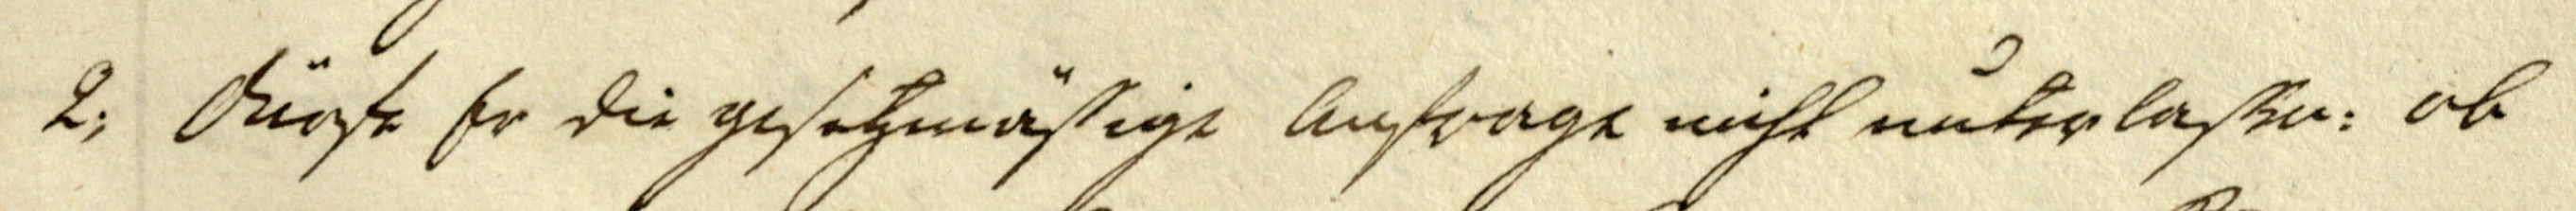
2. Dürfe Er die gesetzmäßige Anfrage nicht unterlassen: ob
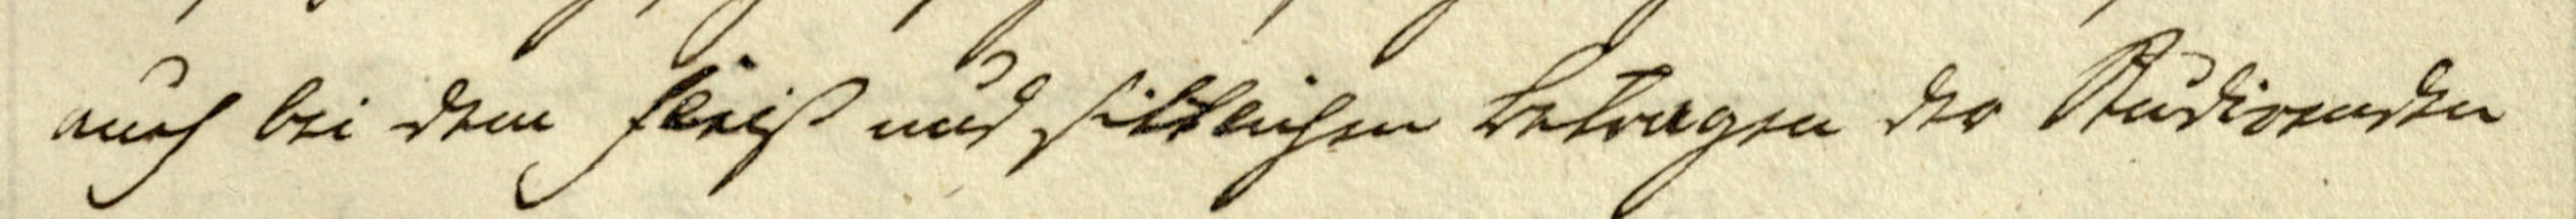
auch bei dem Fleiß und sittlichen Betragen der Studirenden
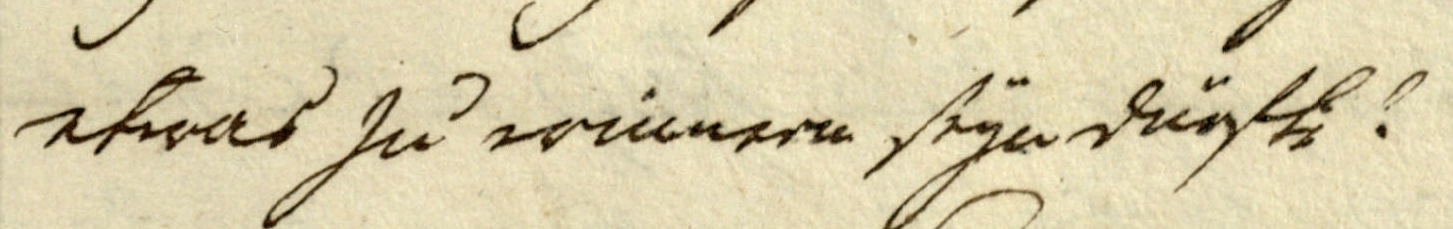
etwas zu erinnern seÿn dürfte?
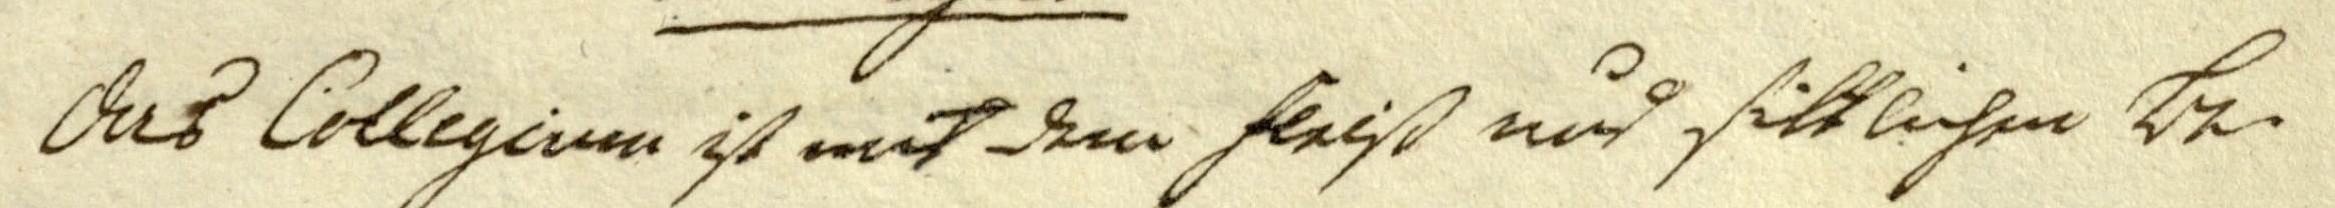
Das Collegium ist mit dem Fleiß und sittlichen Be¬
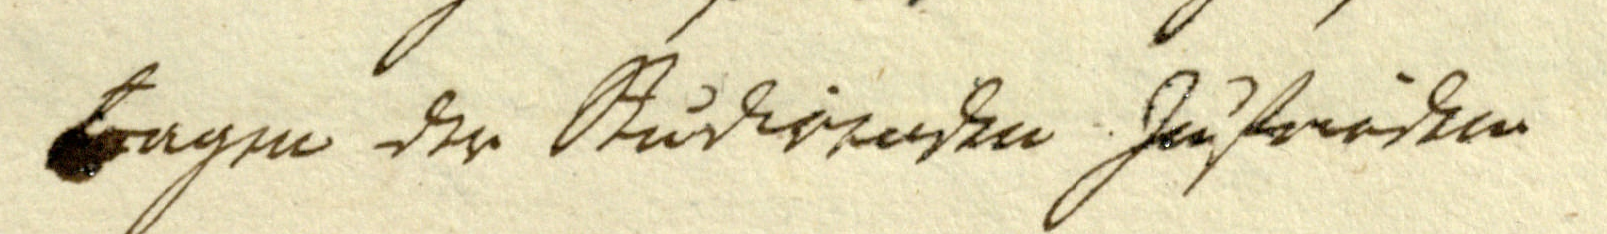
tragen der Studirenden zufrieden.
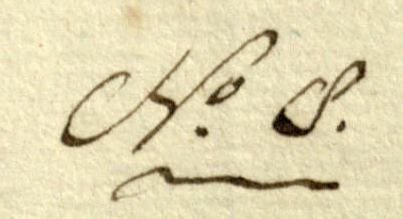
Nº 8.
